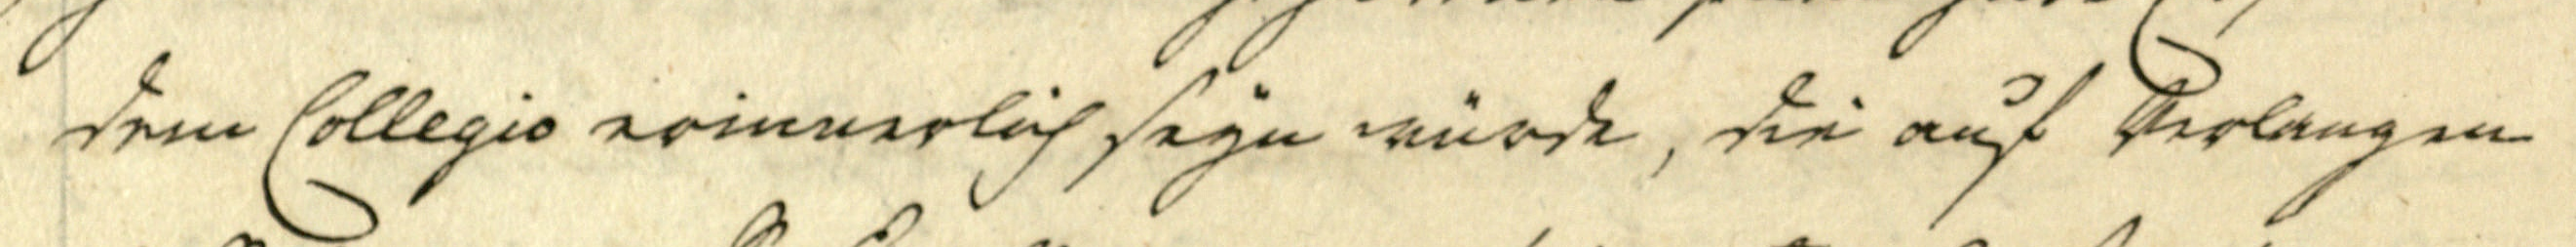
dem Collegio erinnerlich seyn würde, die auf Verlangen
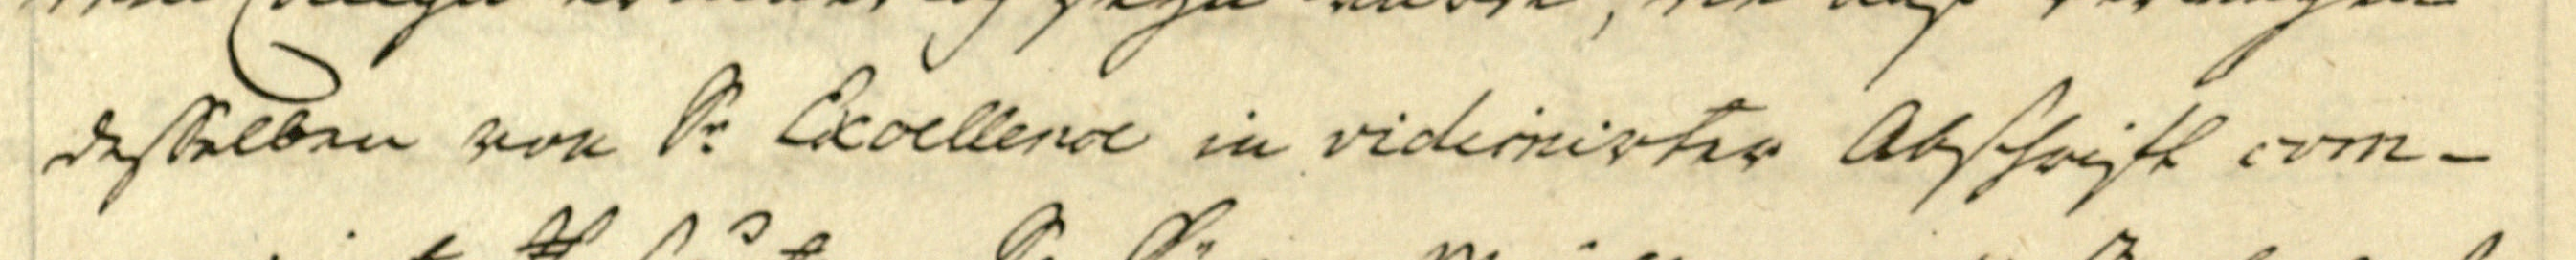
desselben von Sr Excellence in vidimirter Abschrift com¬
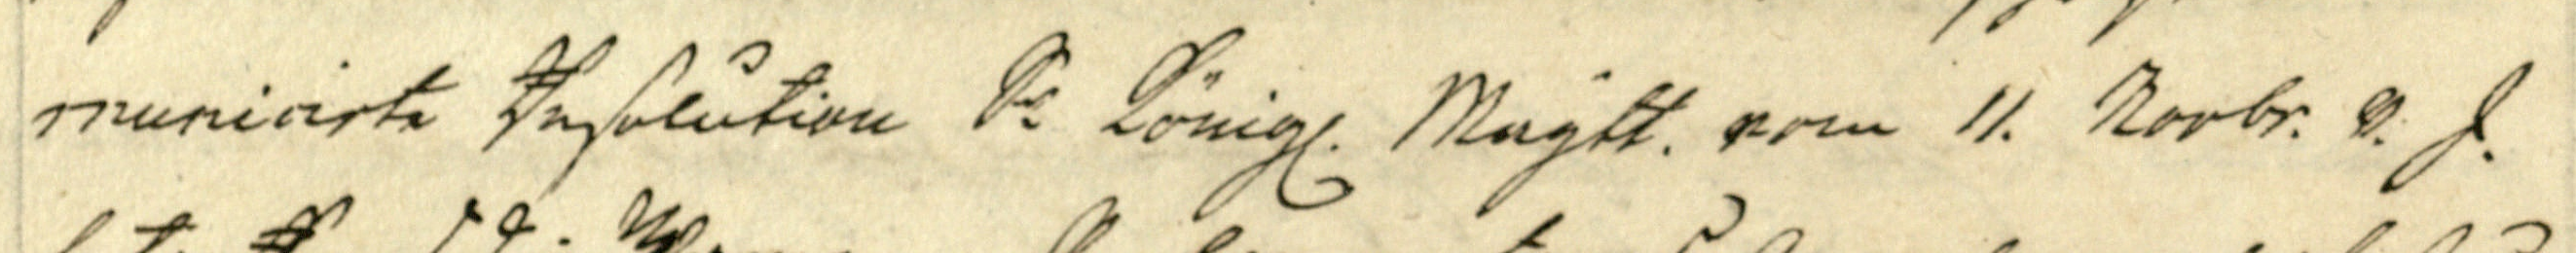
municirte Resolution Sr. Königl. Maÿtt. vom 11. Novbr. v. J.
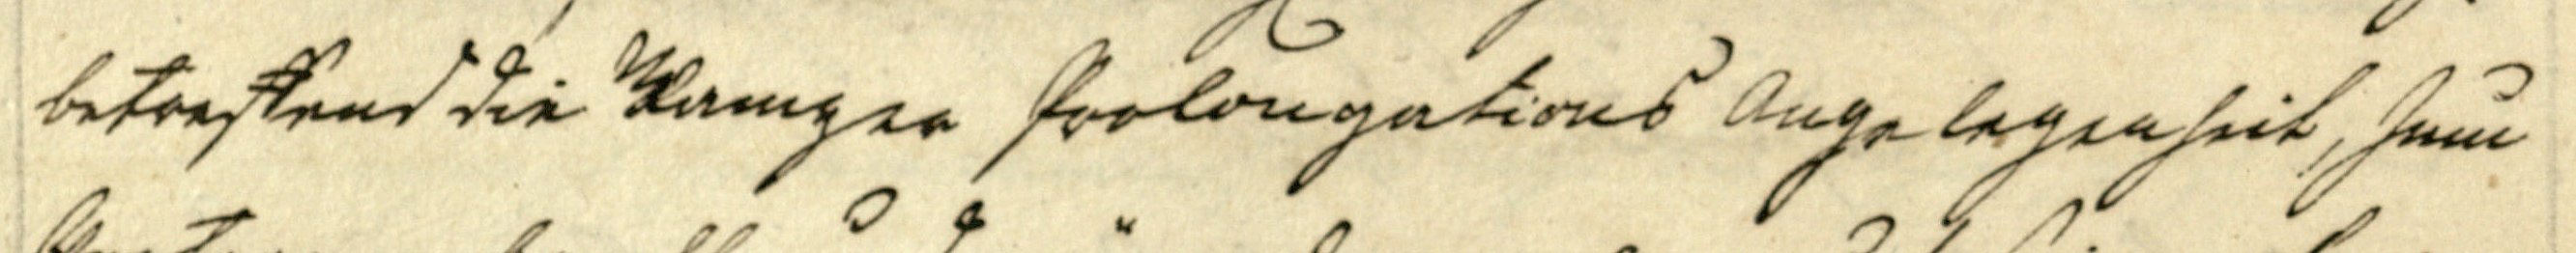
betreffend die Wamper Prolongations Angelegenheit, zum
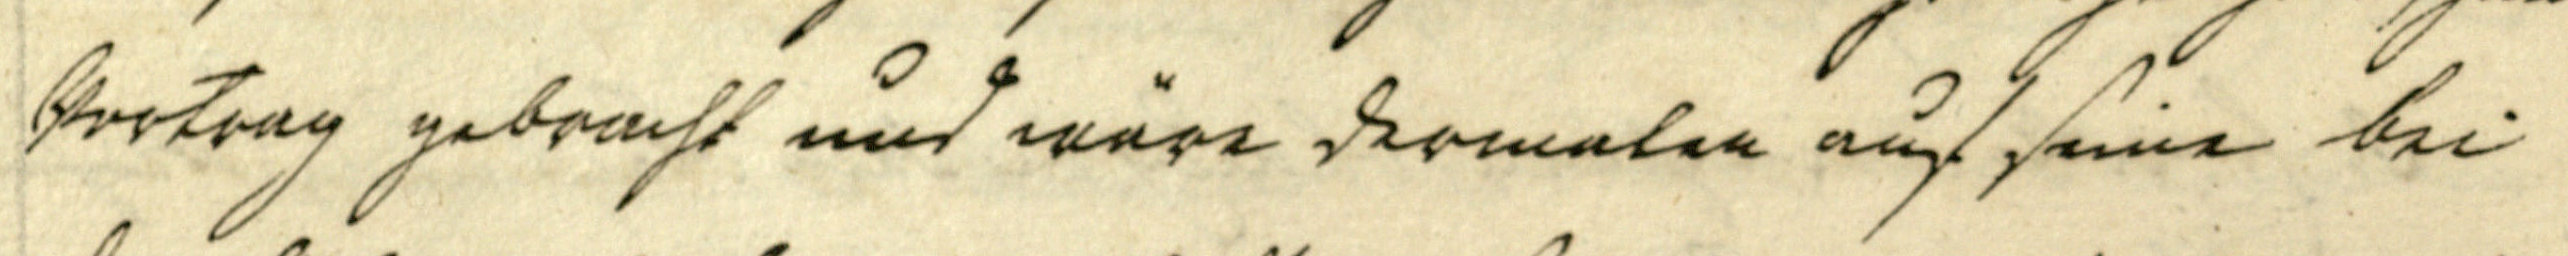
Vortrag gebracht und wäre dermalen auf seine bei
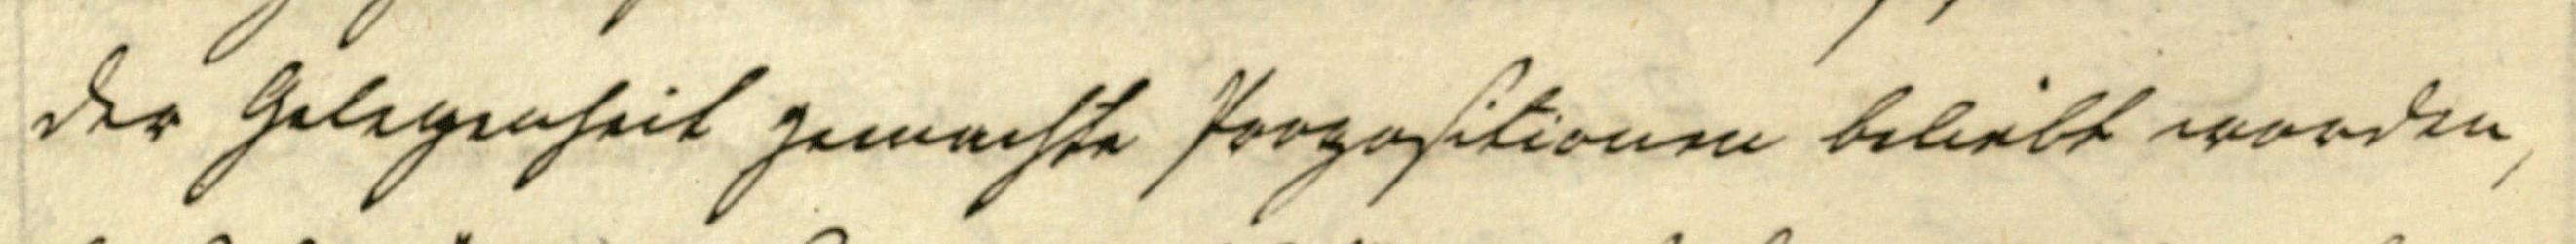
der Gelegenheit gemachte Propositionen beliebt worden,
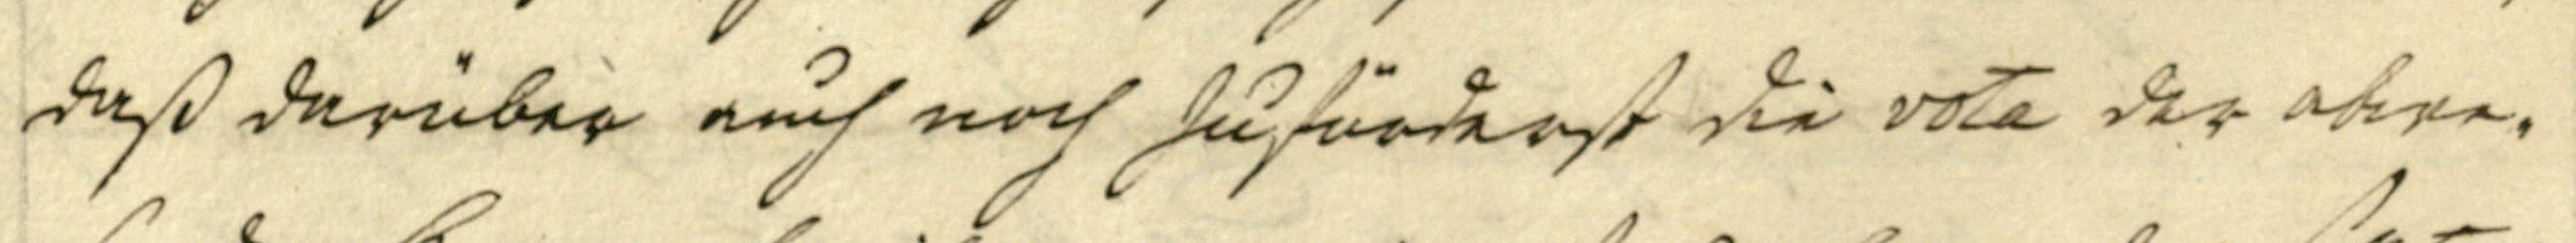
daß darüber auch noch zuförderst die vota der abwe¬
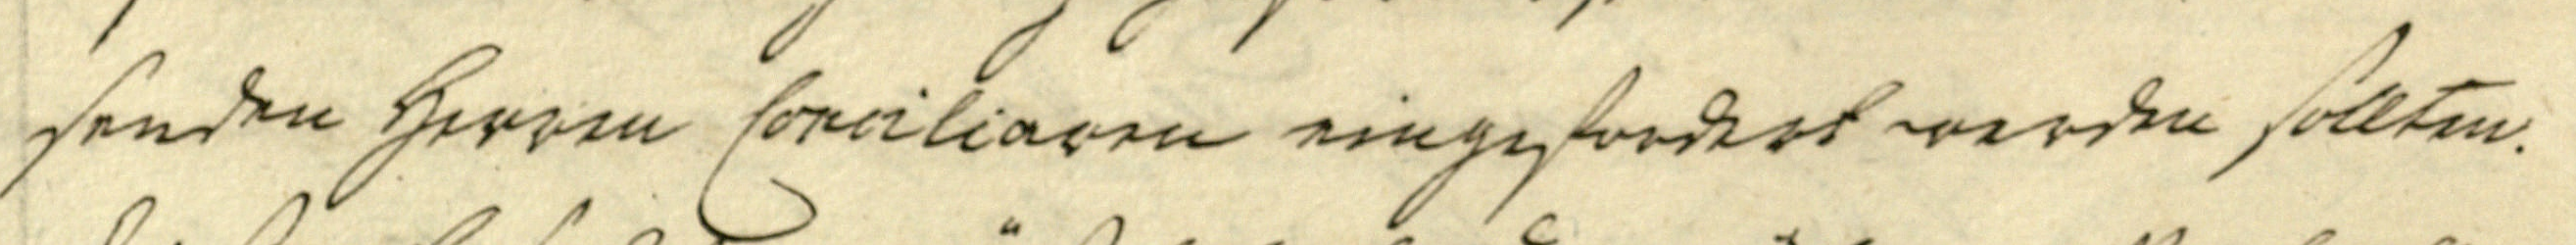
senden Herren Conciliaren eingefordert werden sollten.
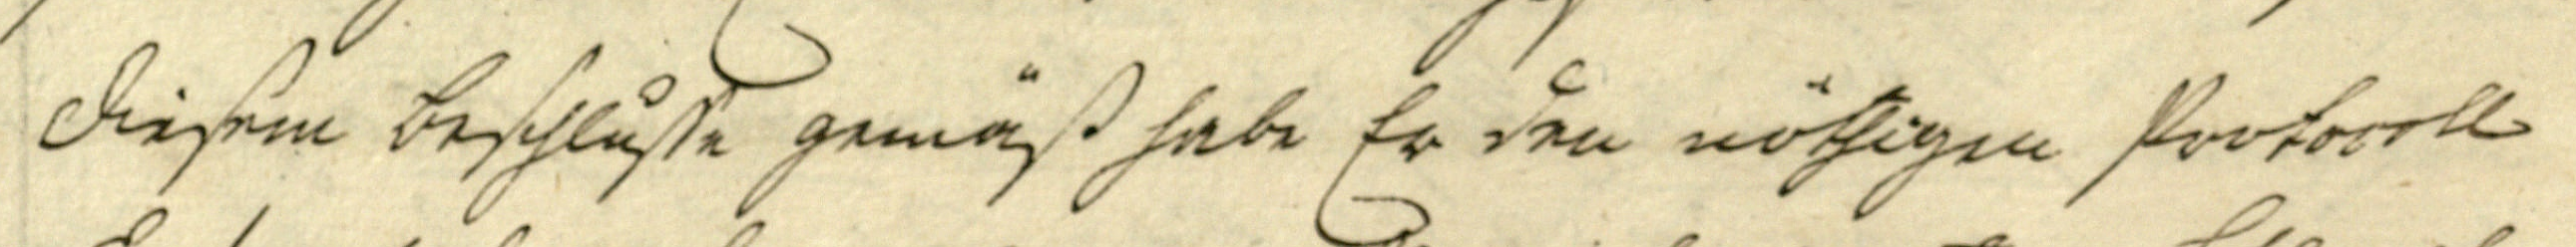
Diesem Beschluse gemäß habe Er den nöthigen Protocoll
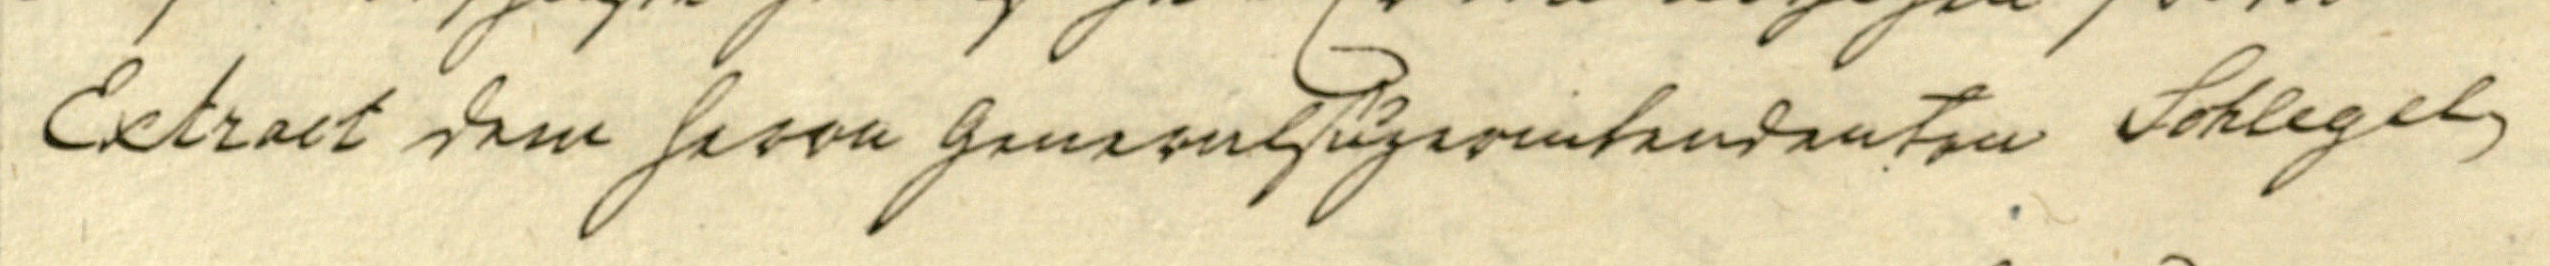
Extract dem Herrn Generalsuperintendenten Schlegel,
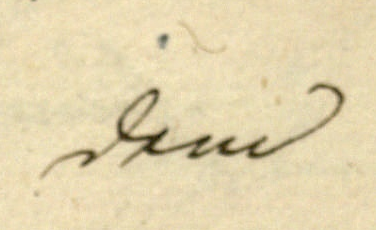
dem
